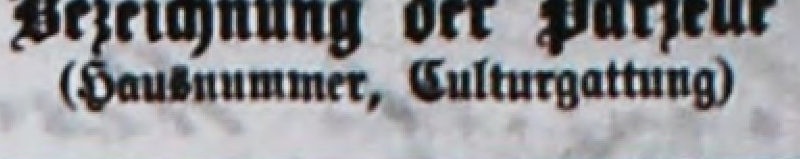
(Hausnummer, Culturgattung)
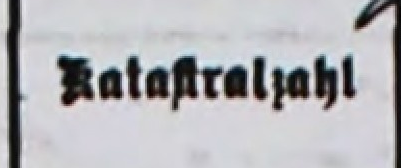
Katastralzahl
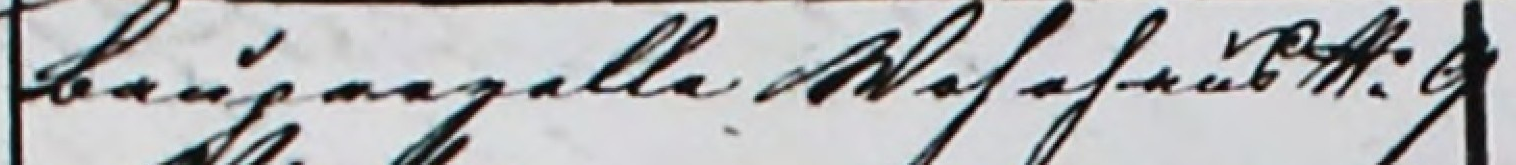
Bauparzelle Wohnhaus No. 9
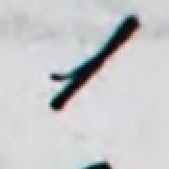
1
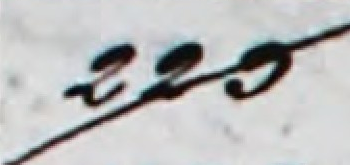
223
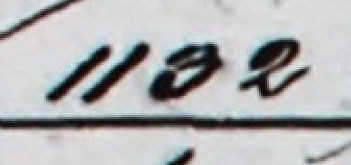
1132
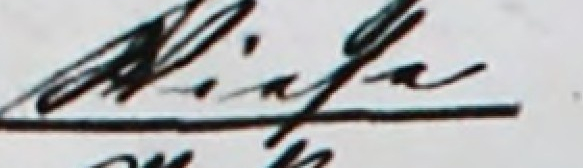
Wiese
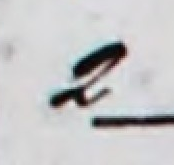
2
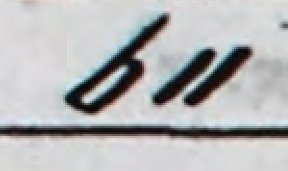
611
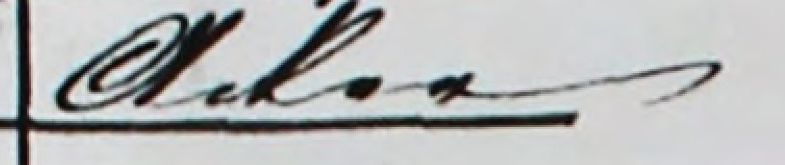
Acker
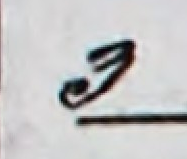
3
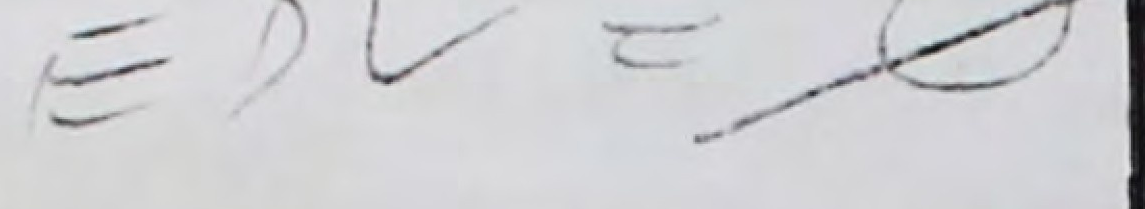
E D V E O
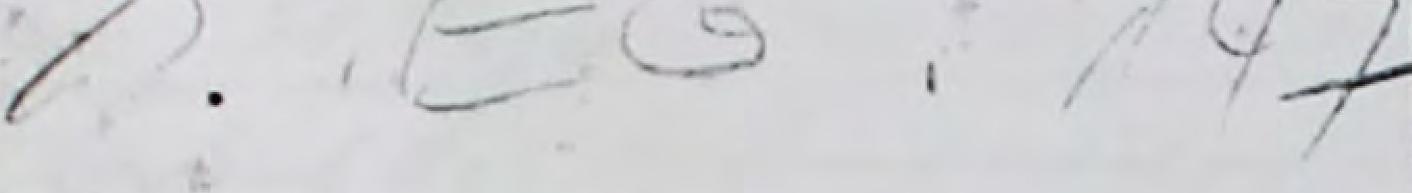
s. E & 147
